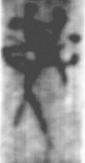○（綴）
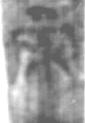兩
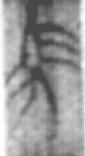馬
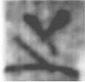之
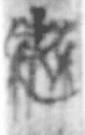○（轡）
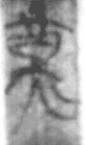黃
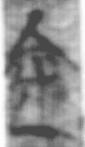金
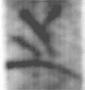之
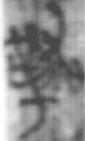○（勒）
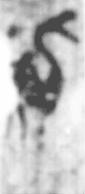紫
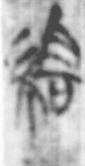○（組）
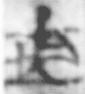珥
